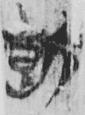折（制）
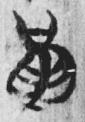革
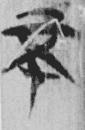不
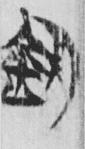○（刃）
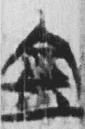金
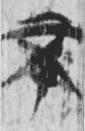不
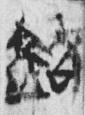鉻（略）
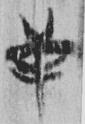矢
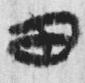田
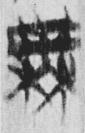無
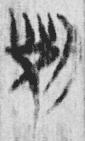○（蔡）
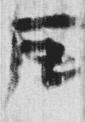厇（宅）
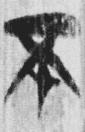不
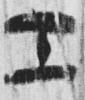工（空）
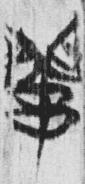○（關）
